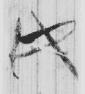女
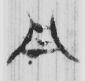丹
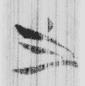之
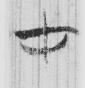才
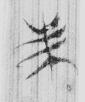朱
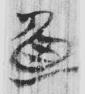廼
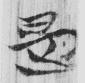是
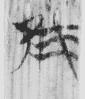隹
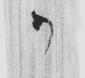人
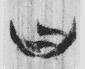曰
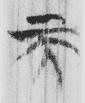天
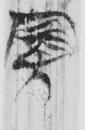{今見}
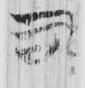司
